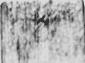州
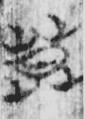莫
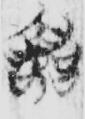囂
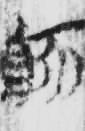疥
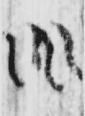州
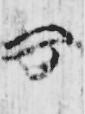司
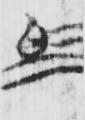馬
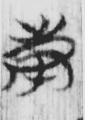庚
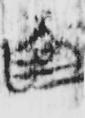爲
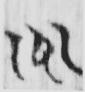州
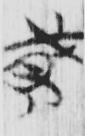貸
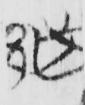○（越）
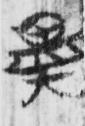異
